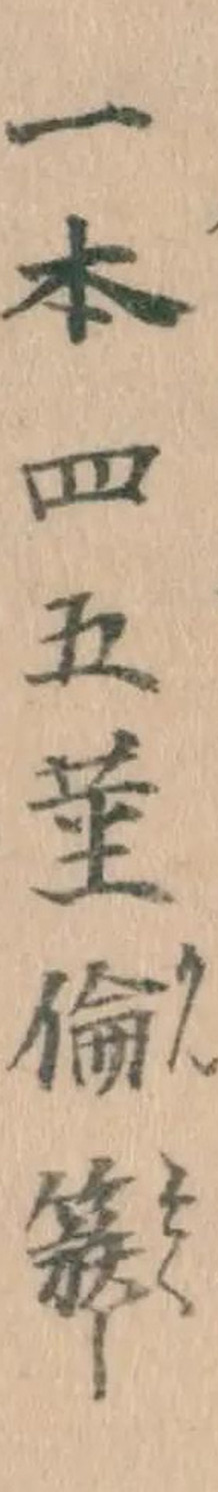一本四五茎倫簇し
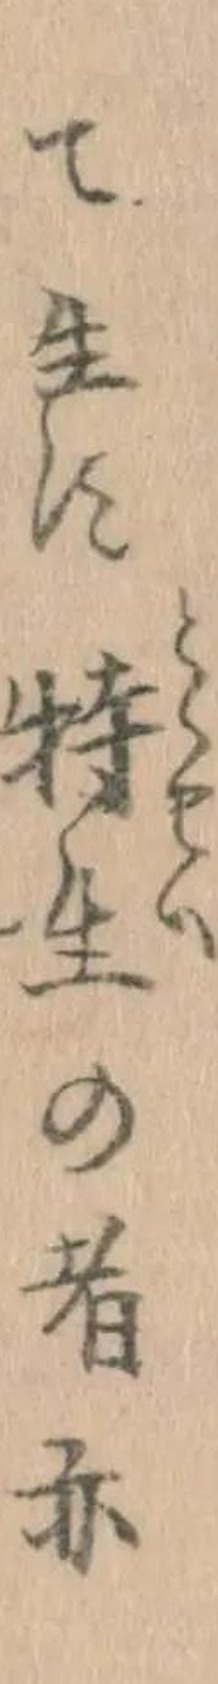て生す特生の者亦
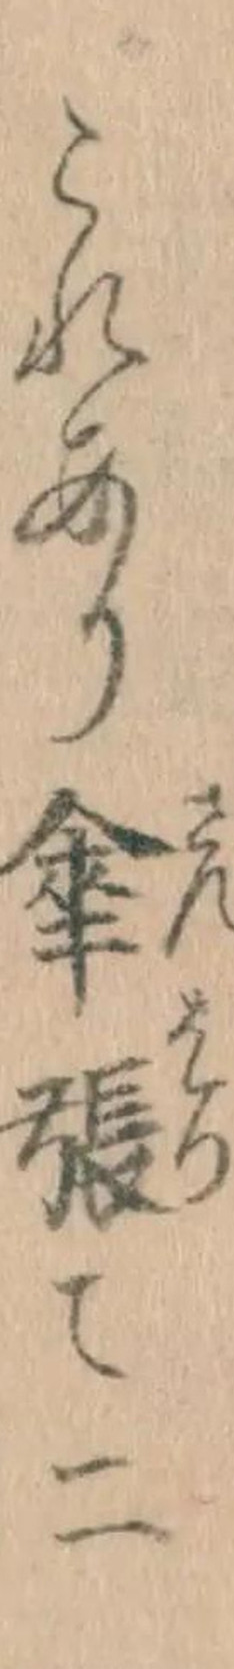これあり傘張て二
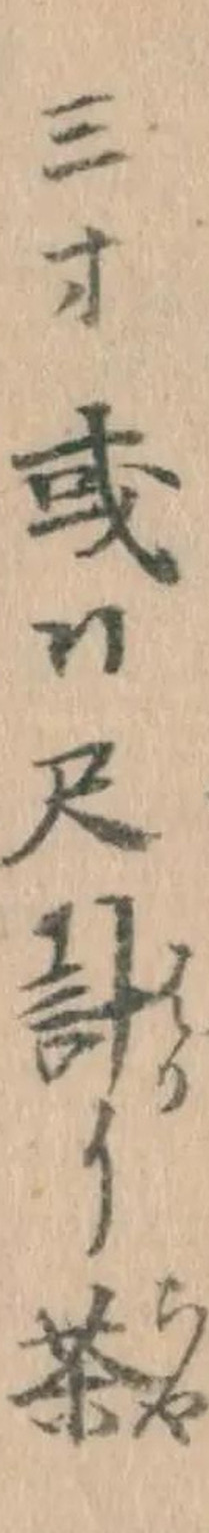三寸或は尺計り茶
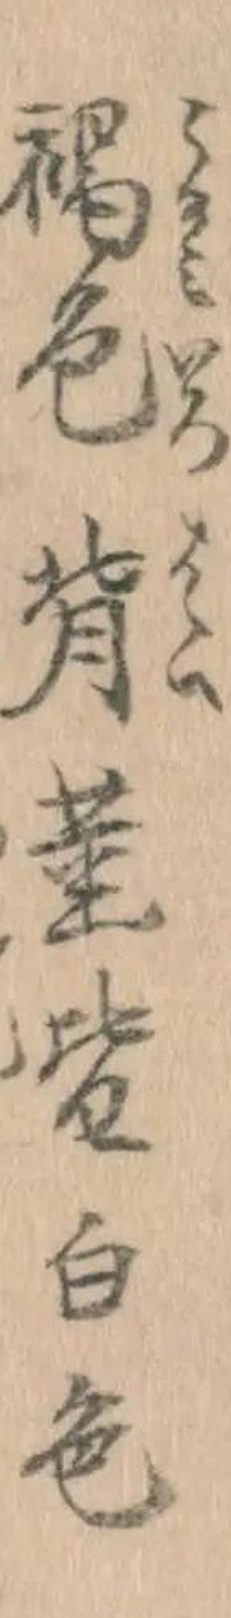褐色背茎皆白色
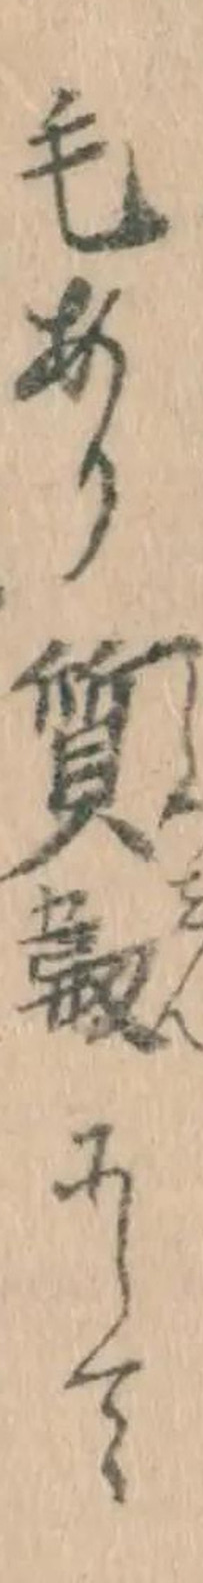毛あり質韌にして
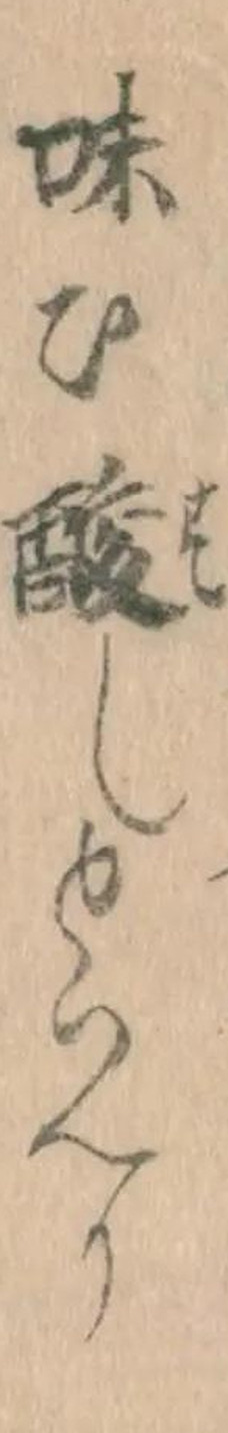味ひ酸しといへり

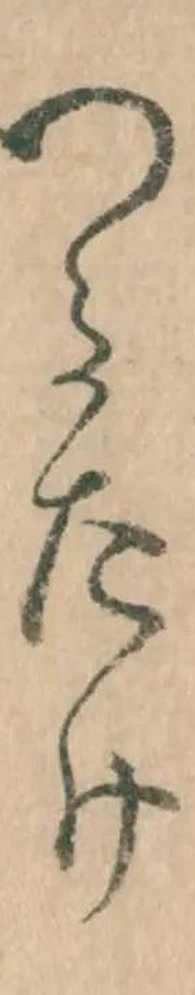つるたけ
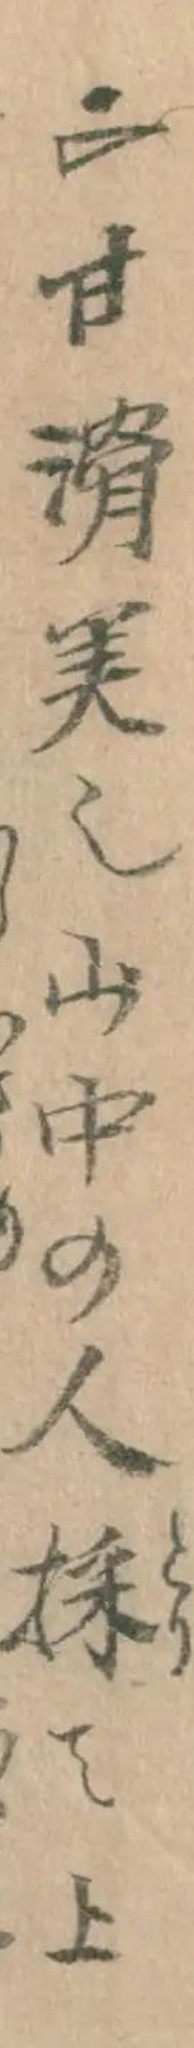・▷甘滑美也山中の人採て上
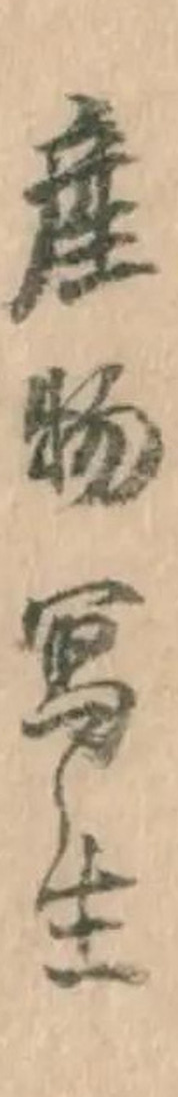産物写生
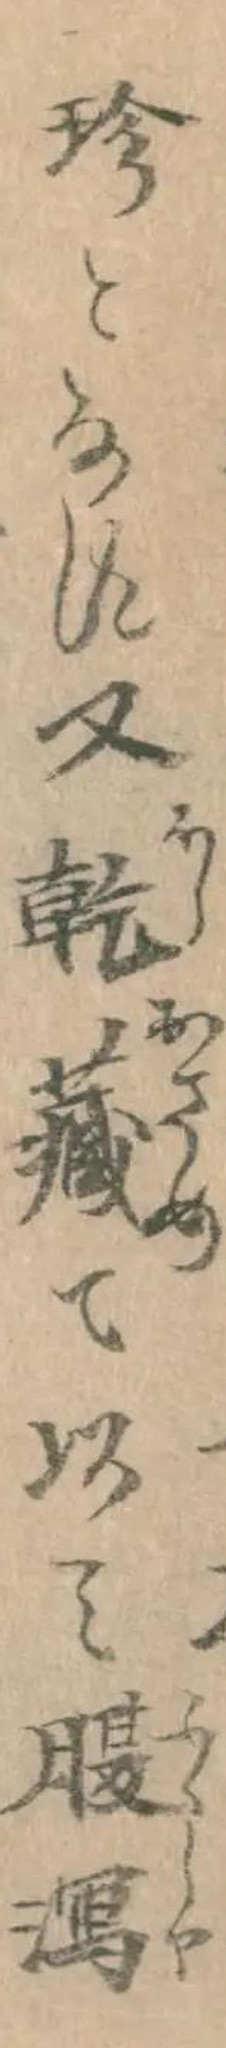珍となす又乾蔵て以て腹瀉
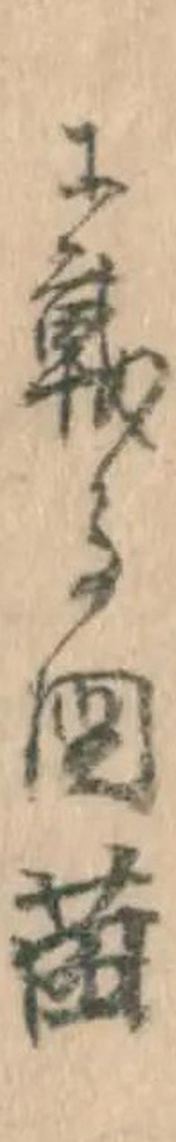に載る図菌
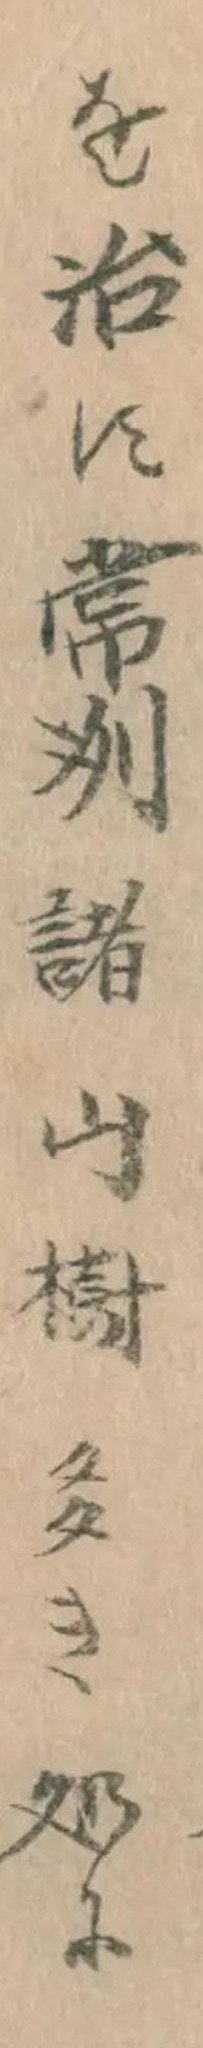を治す常州諸山樹多き処に
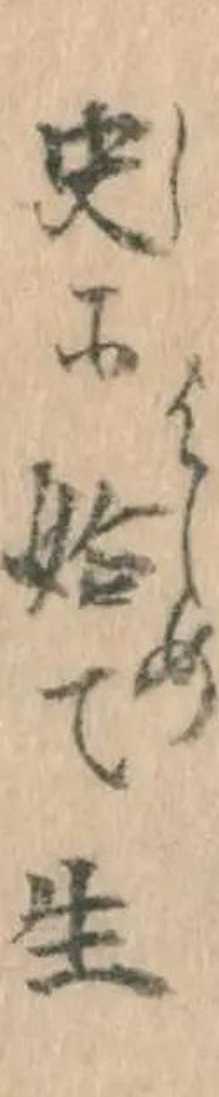史に始て生
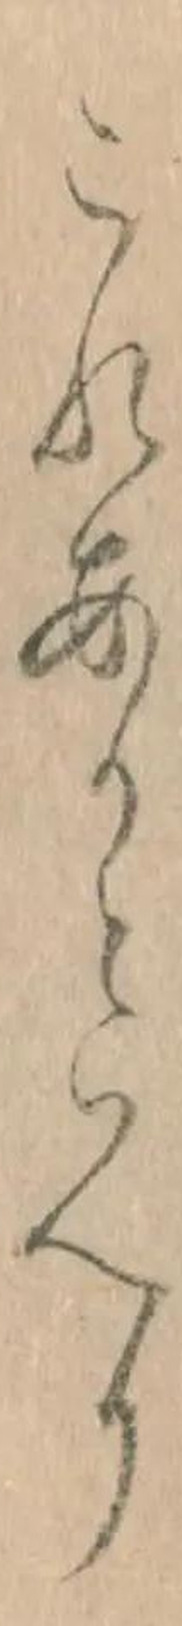これありといへり
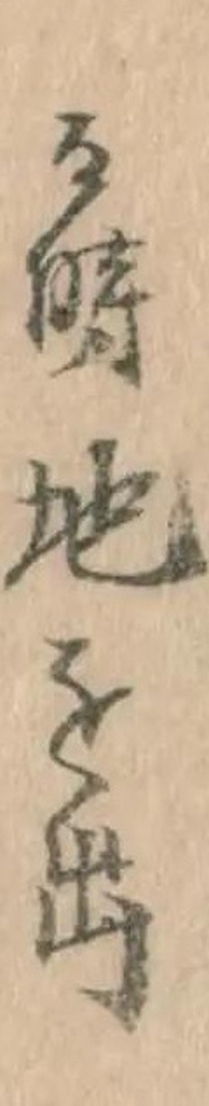る時地を出
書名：本草図譜. 巻58-60
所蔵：国立国会図書館 National Diet Library, JAPAN
